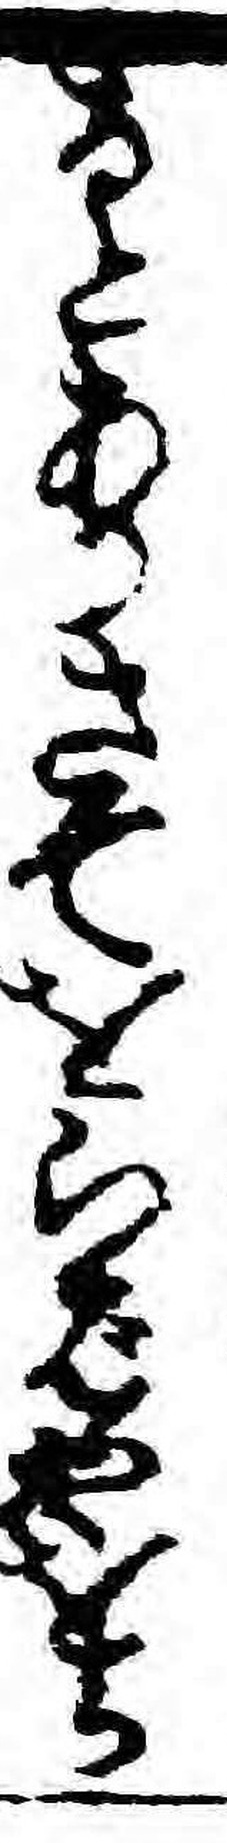るとありさてをらばやをら
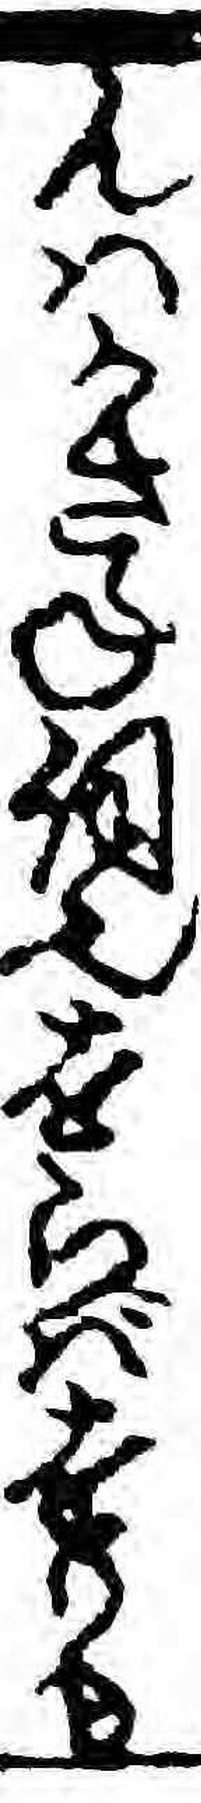んはかさね詞也をらばをりも
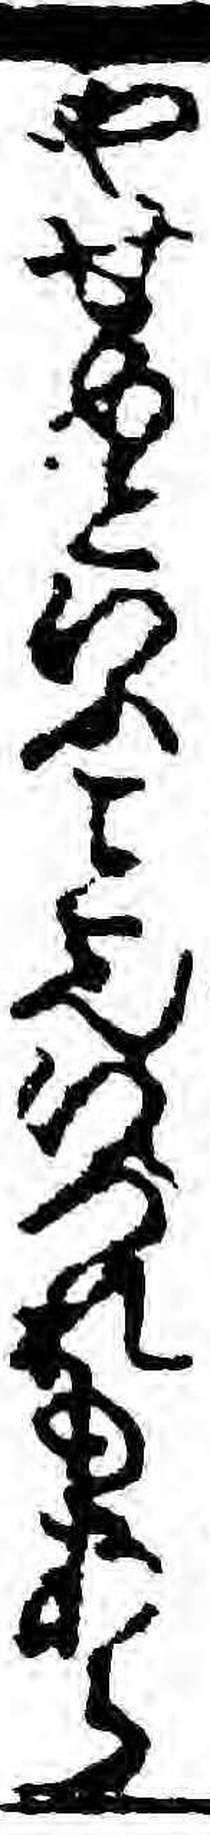やせめといふこと也いづれもあら
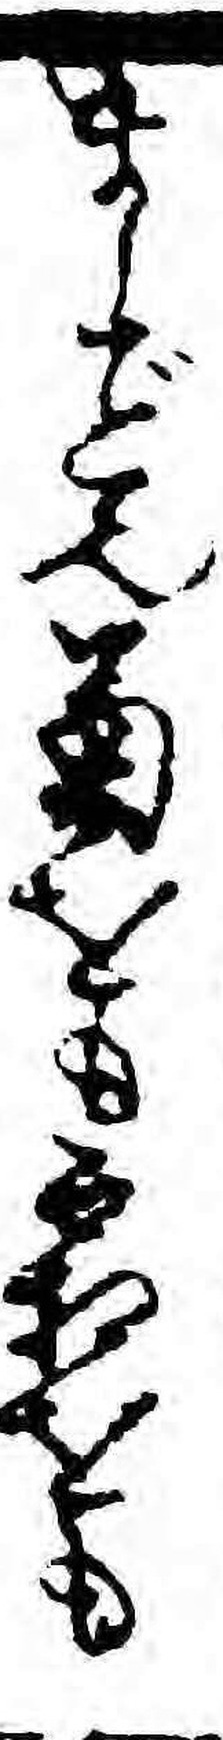ましごと也菊をも霜をも
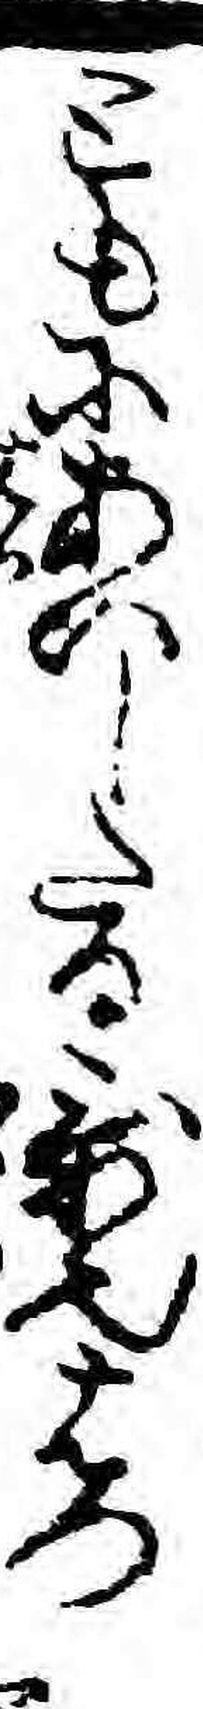ともにあいしたる哥也はつ
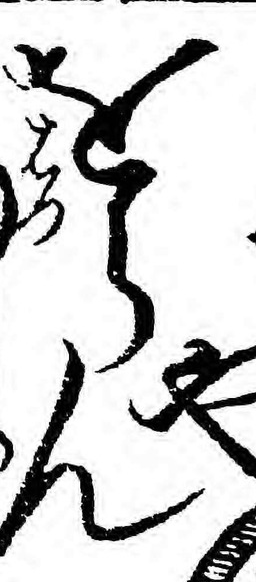をらん
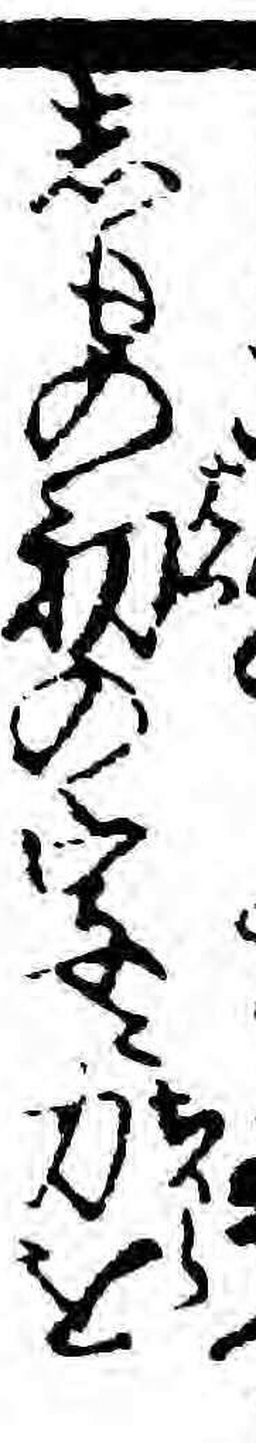しもの初の字に力を
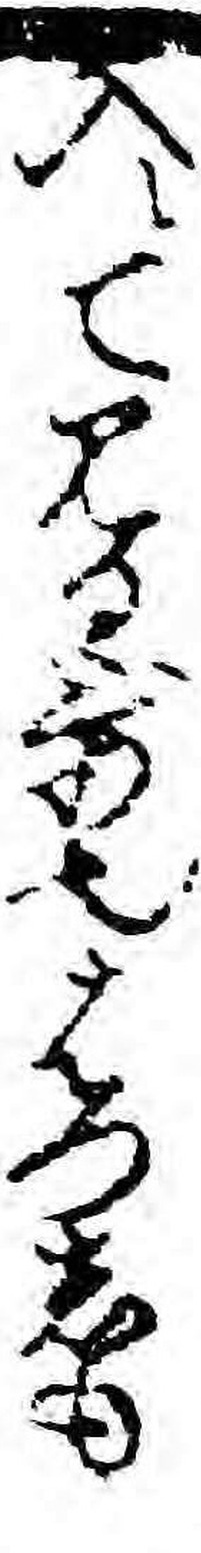入れて見る哥也はつしも
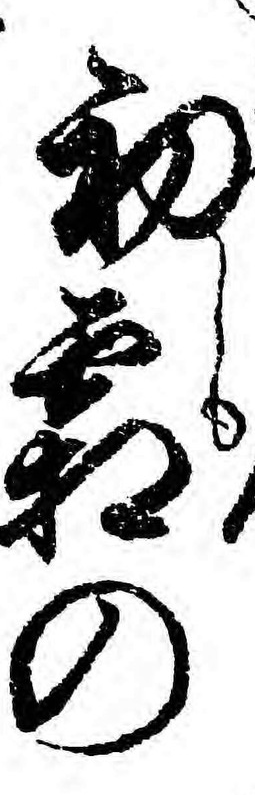初霜の
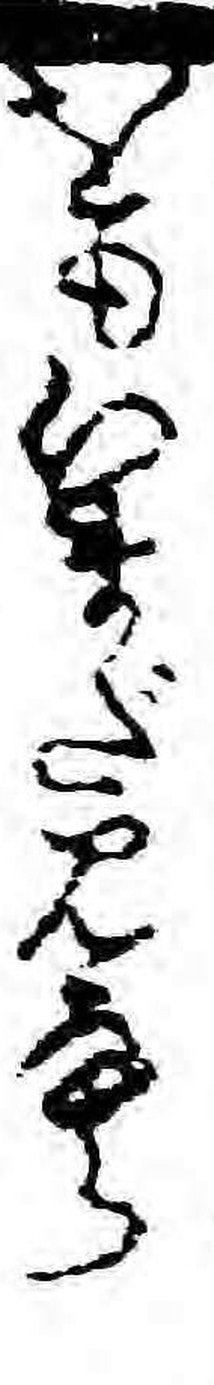をもいまだ見なら
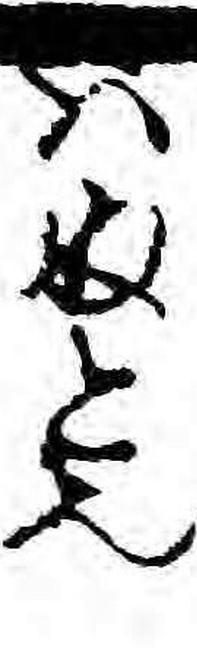はぬと也
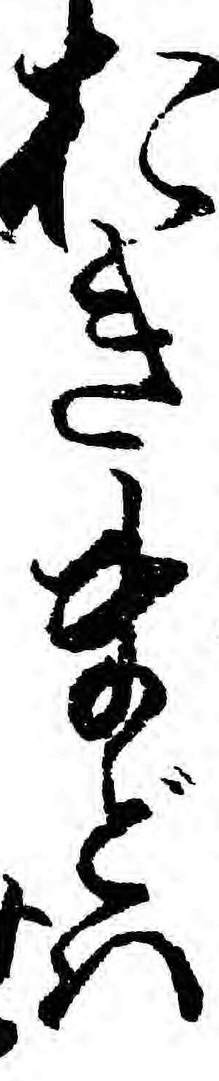おきまどは
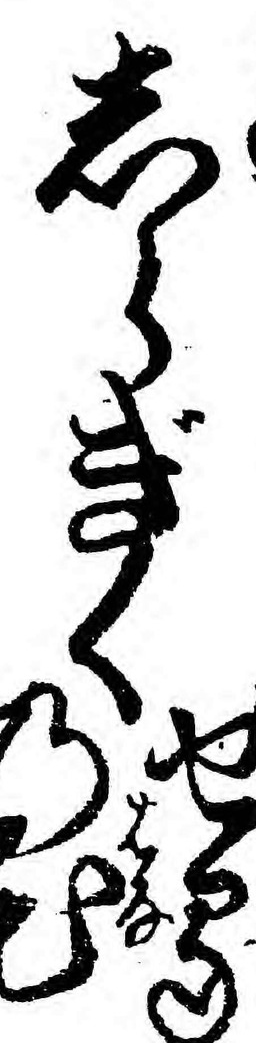しらぎくの花

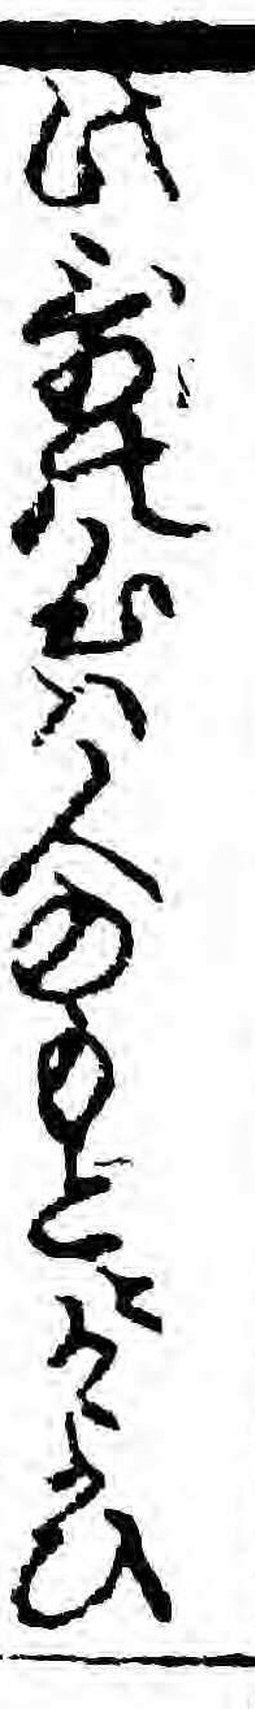此哥の心は人のもとにかよひ
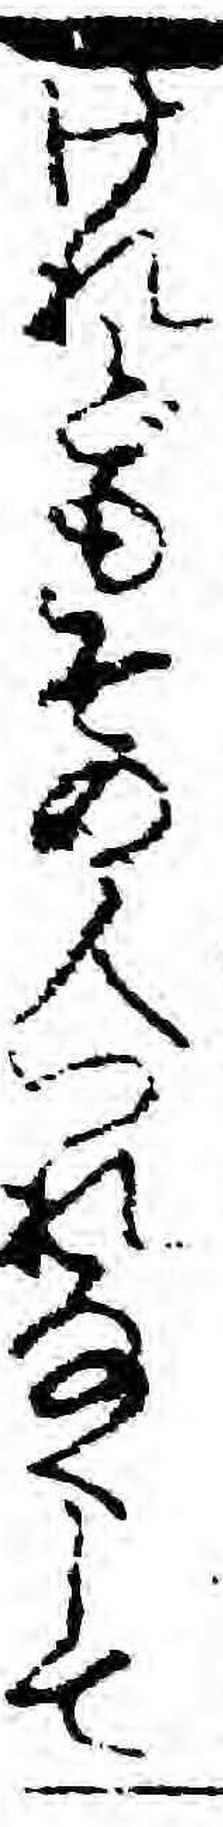けれどもその人つれなくして
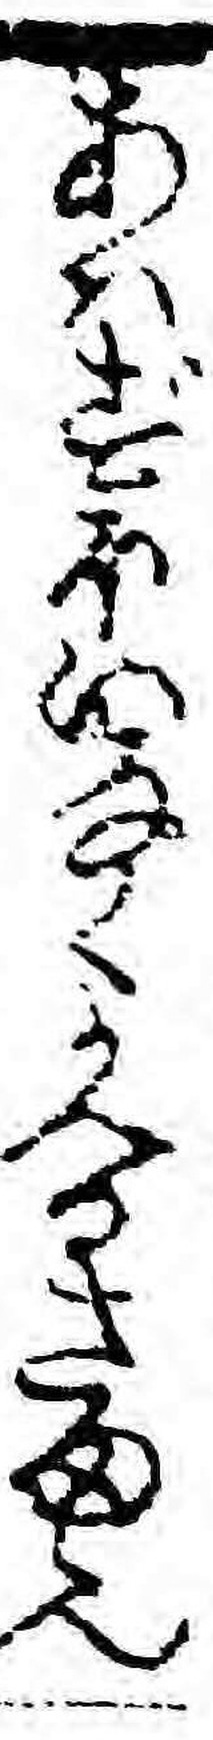あはずほいなくかへるさまなり
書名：頭書和歌注譯／壽賀多百人一首小倉錦
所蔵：国文学研究資料館
